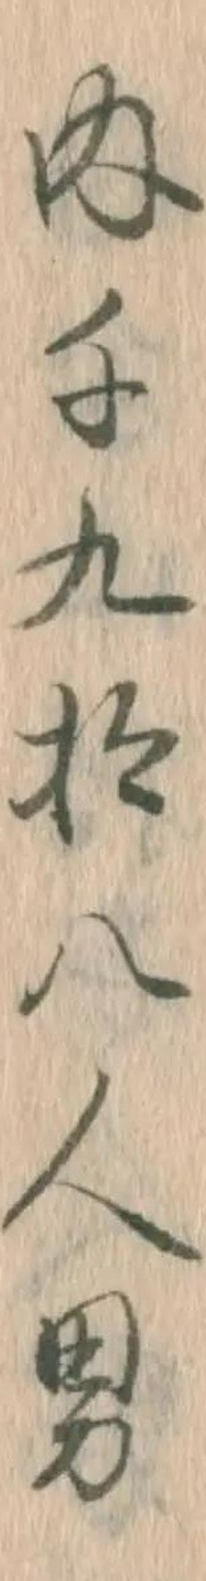内千九拾八人男
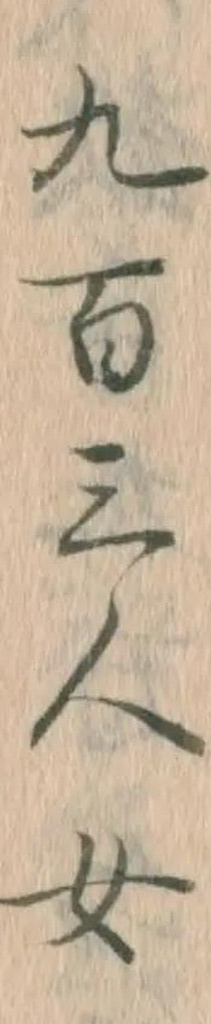九百三人女
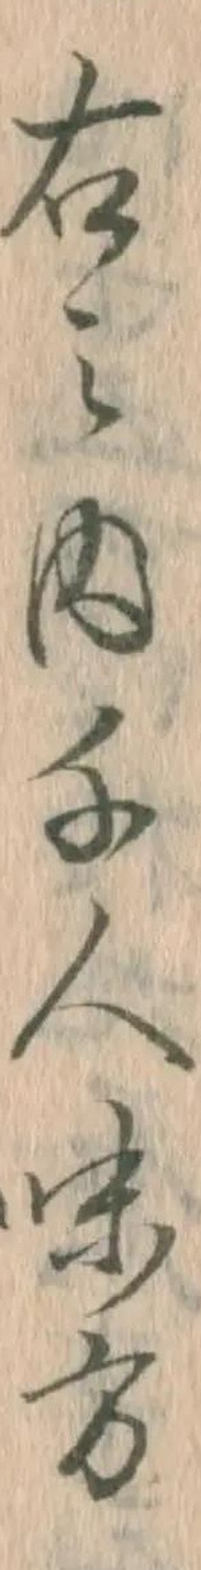右之内千人味方
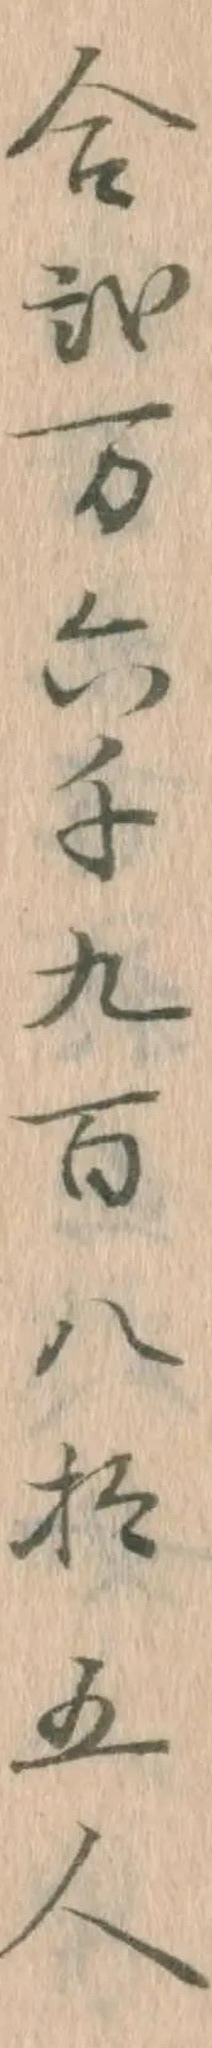合弐万六千九百八拾五人
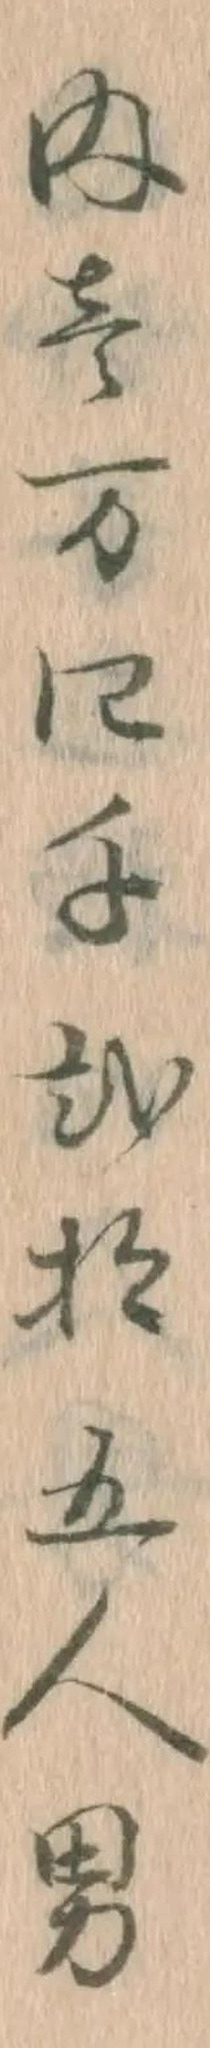内壱万四千弐拾五人男
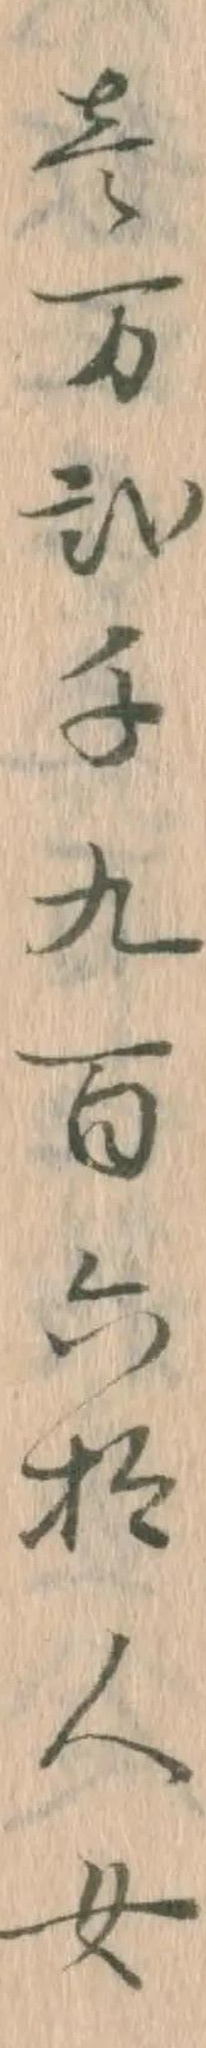壱万弐千九百六拾人女
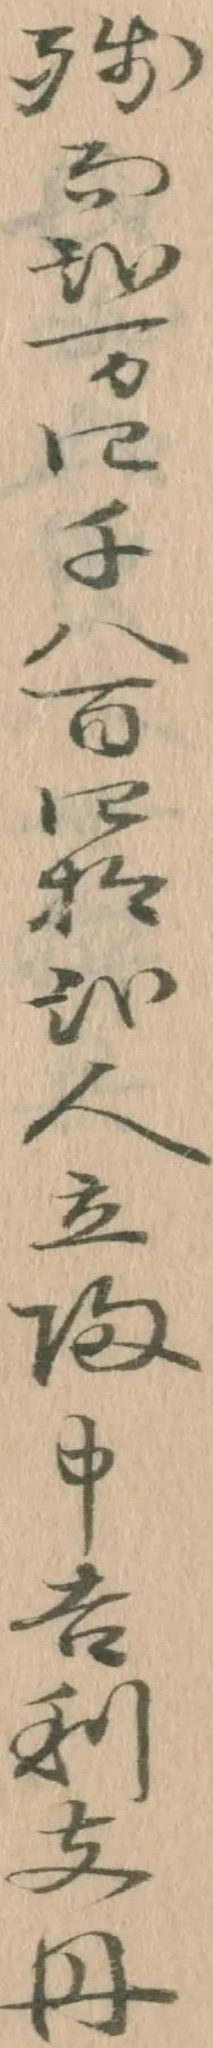残而弐万四千八百四拾弐人立帰申吉利支丹
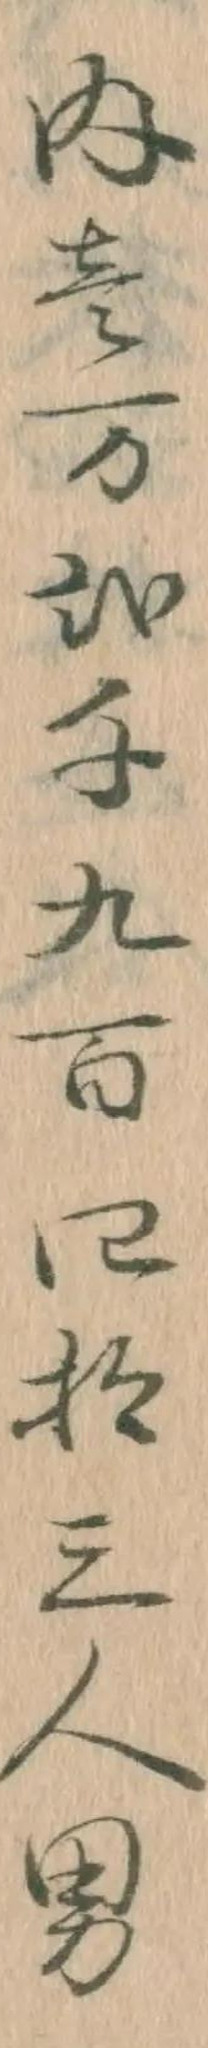内壱万弐千九百四拾三人男
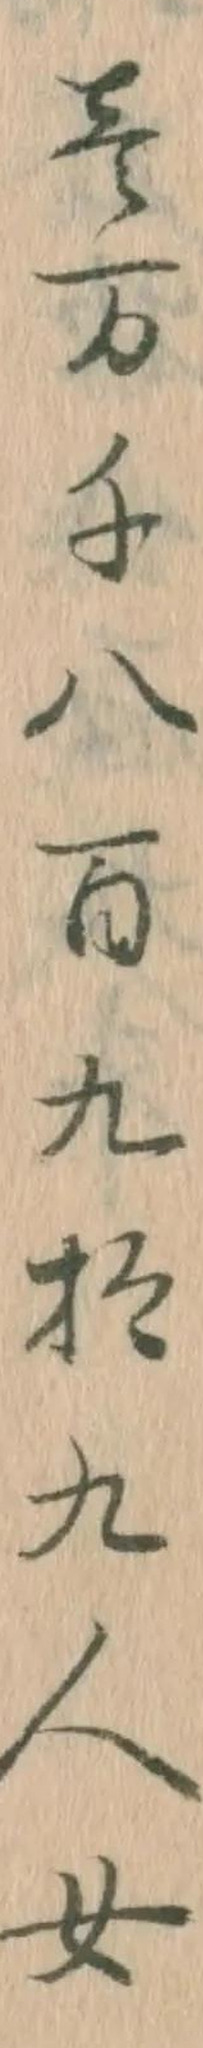壱万千八百九拾九人女
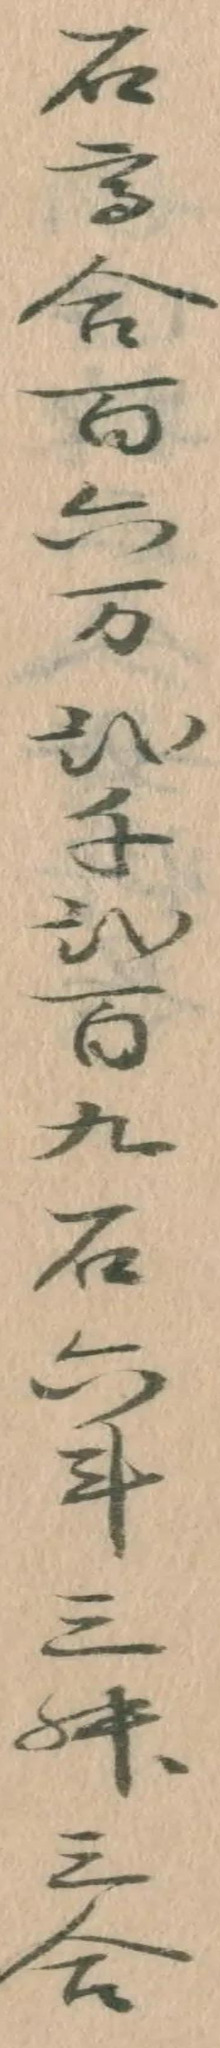石高合百六万弐千弐百九石六斗三升三合
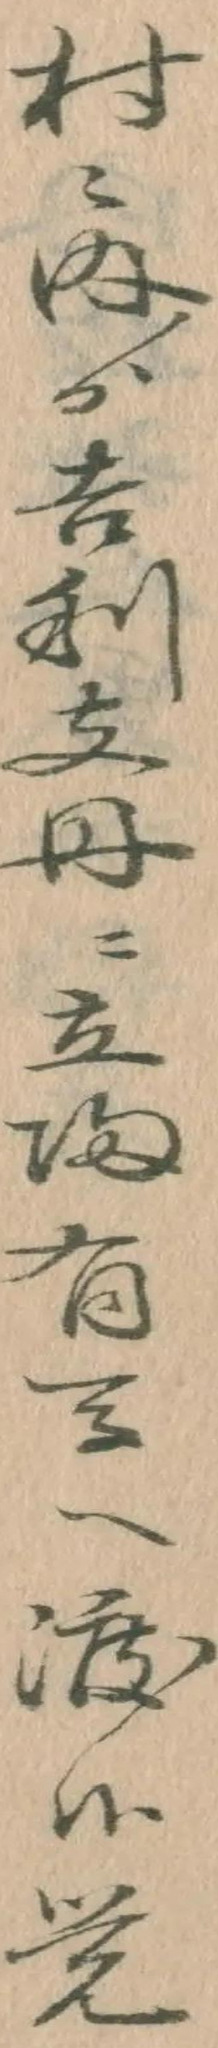村々内ゟ吉利支丹に立帰有馬へ渡候覚
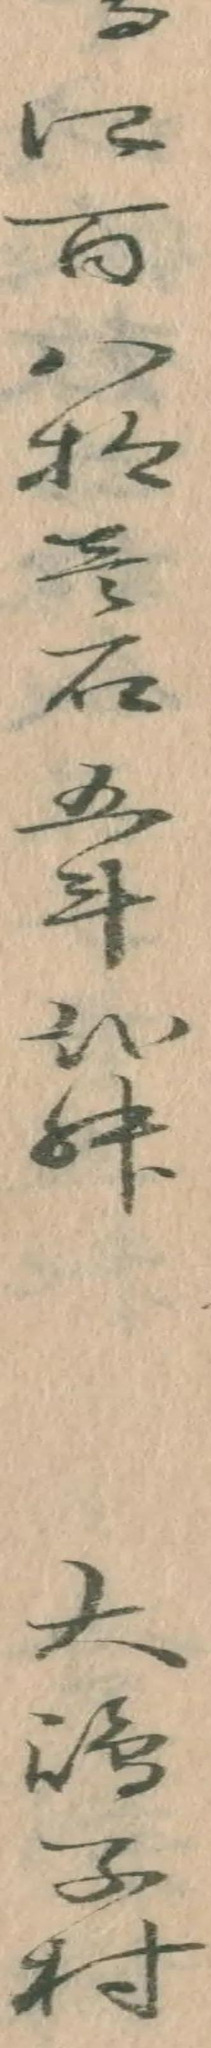高四百八拾壱石五斗弐升大島子村
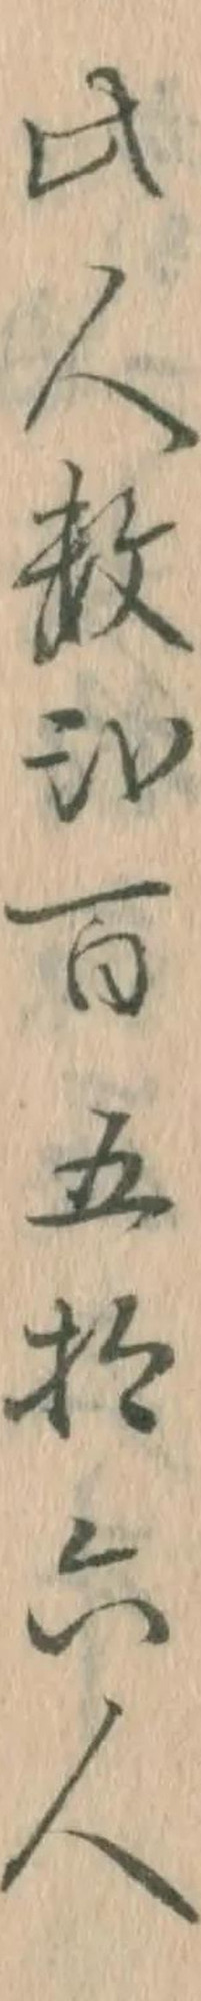此人数弐百五拾六人
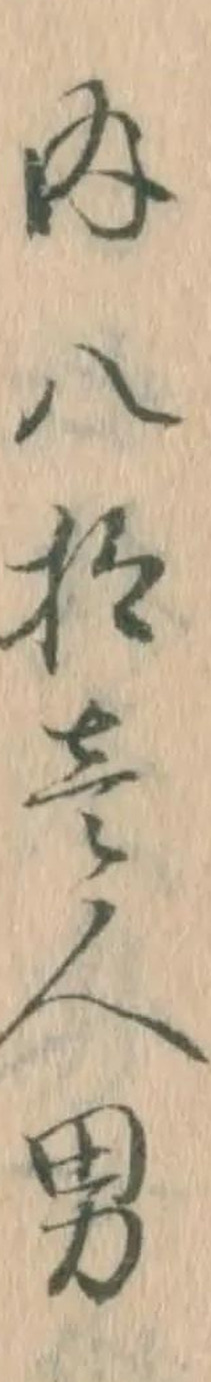内八拾壱人男
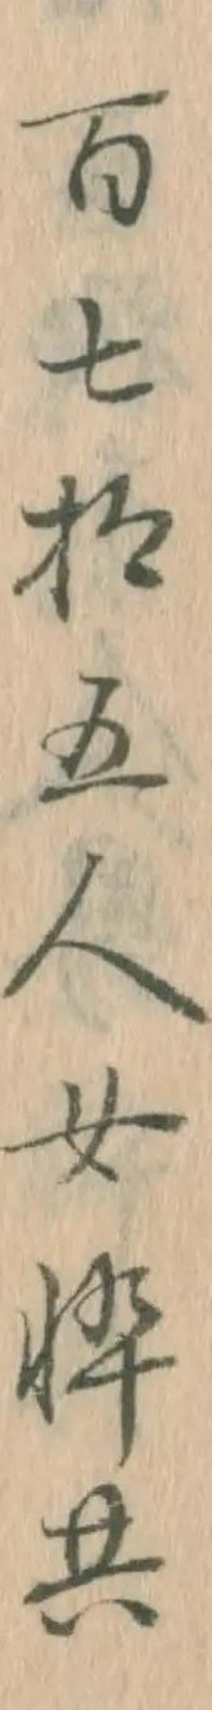百七拾五人女忰共

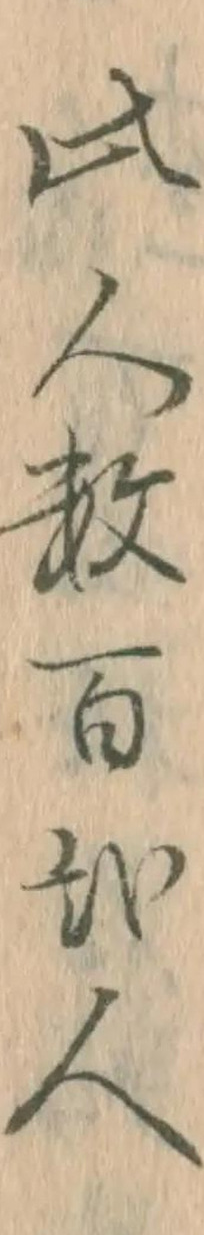此人数百弐人
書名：切支丹御退治記 49巻. [2]
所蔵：国立国会図書館 National Diet Library, JAPAN
